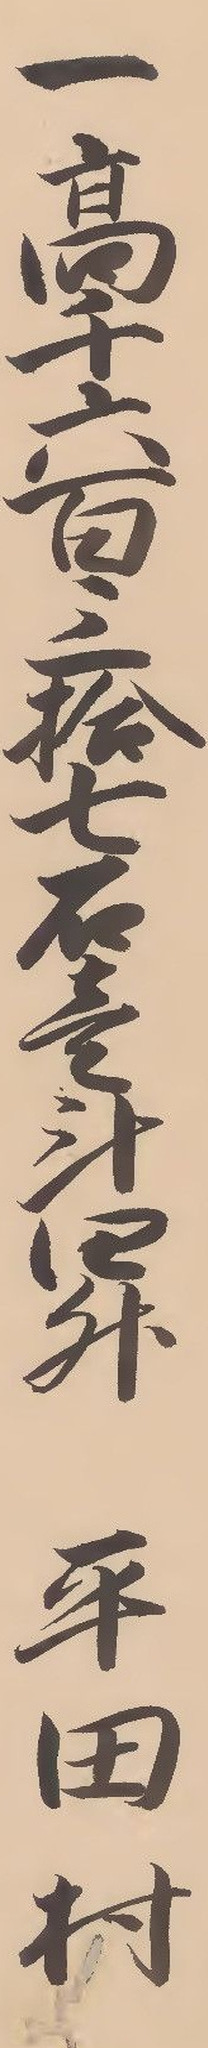一高千六百三拾七石壱斗四升平田村
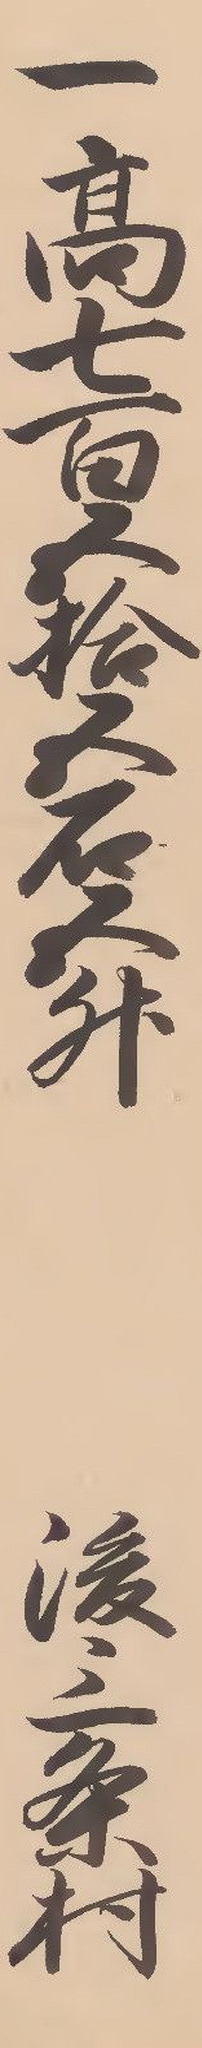一高七百五拾五石五升後三条村

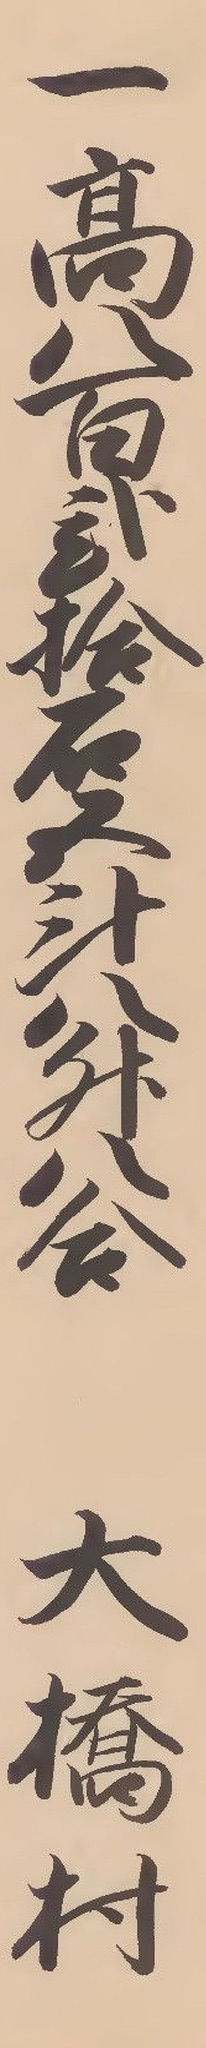一高八百弐拾石五斗八升八合大橋村
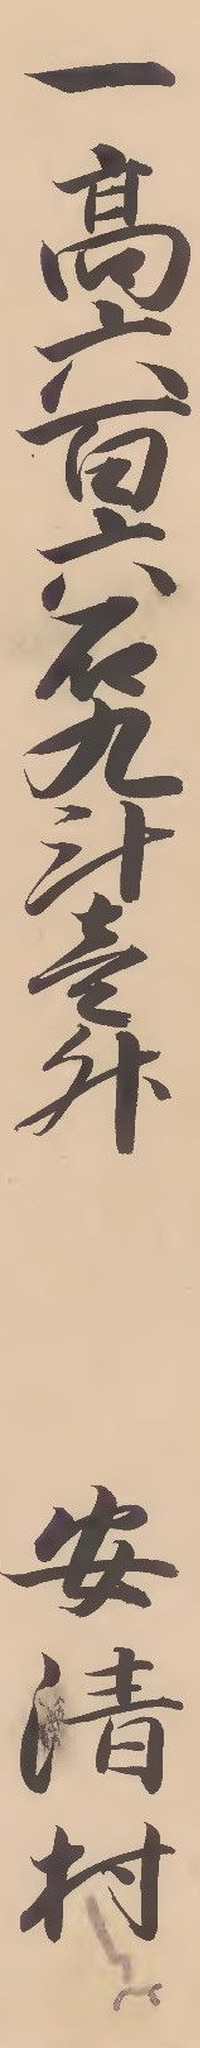一高六百六石九斗壱升安清村
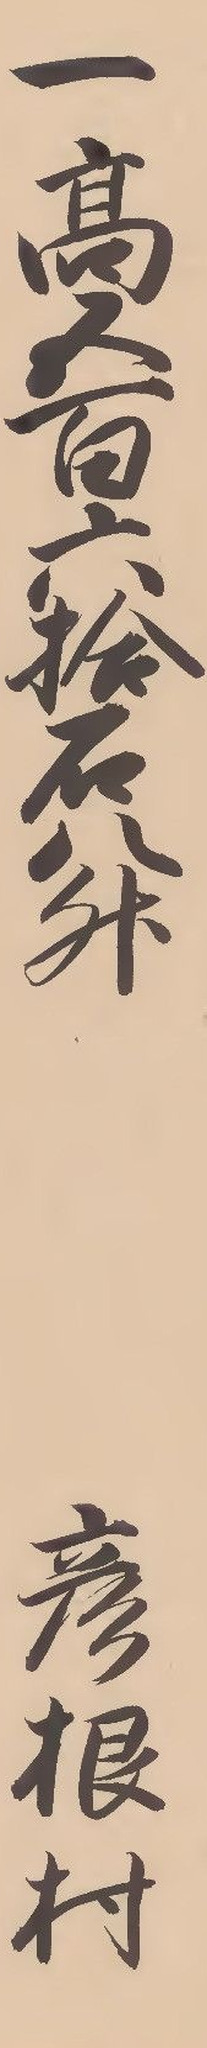一高五百六拾石八升彦根村
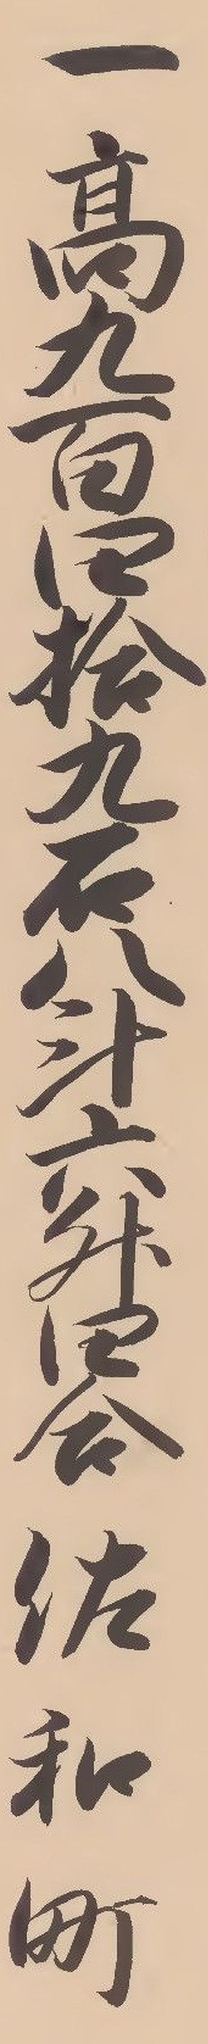一高九百四拾九石八斗六升四合佐和町
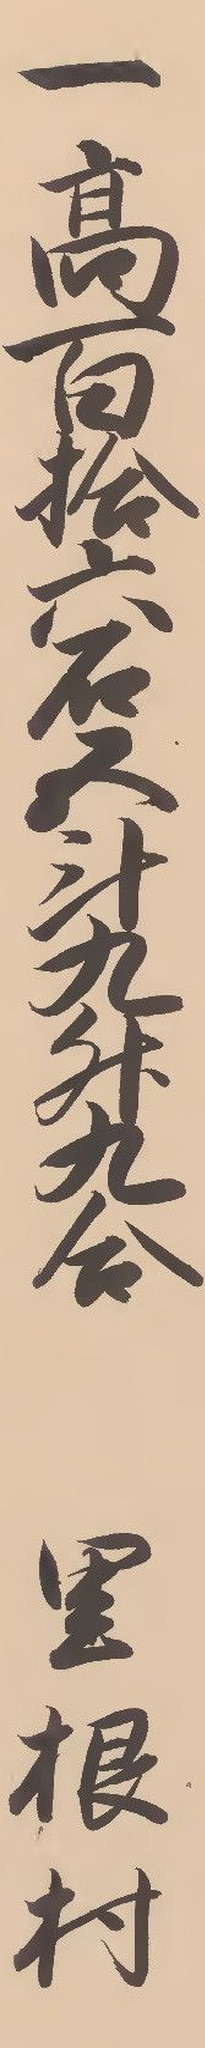一高百拾六石五斗九升九合里根村
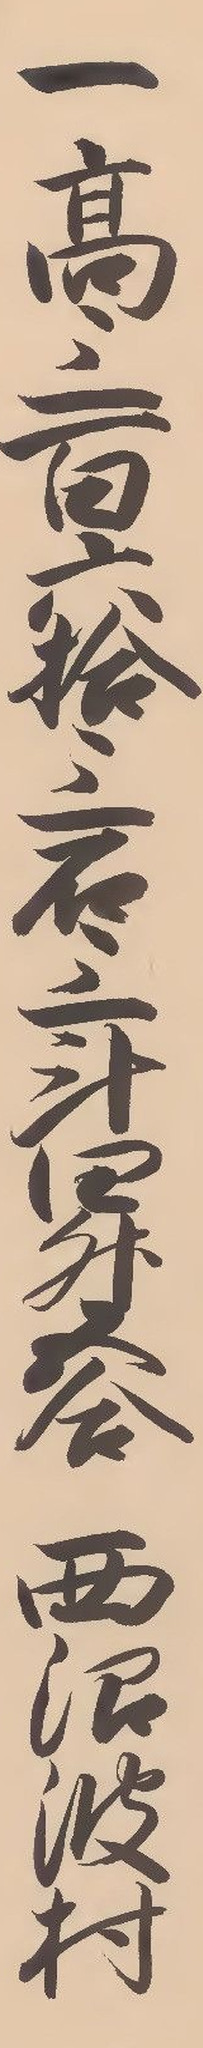一高三百六拾三石三斗四升五合西沼波村
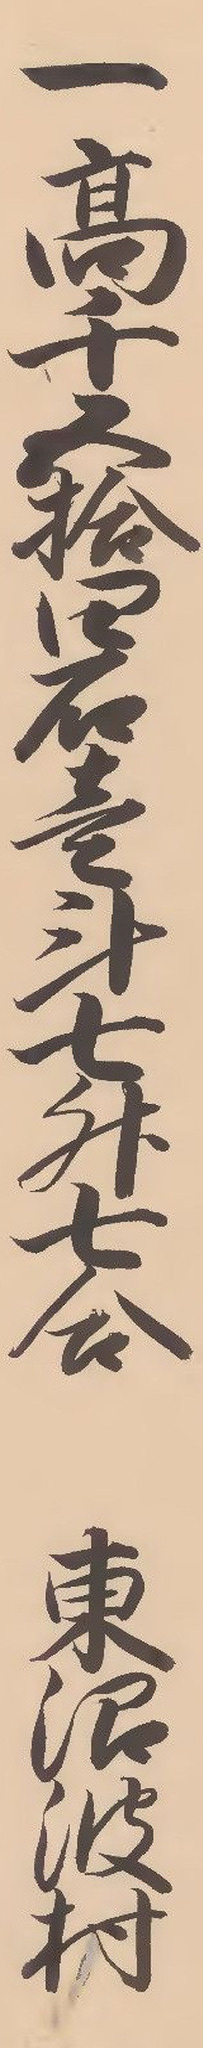一高千五拾四石壱斗七升七合東沼波村
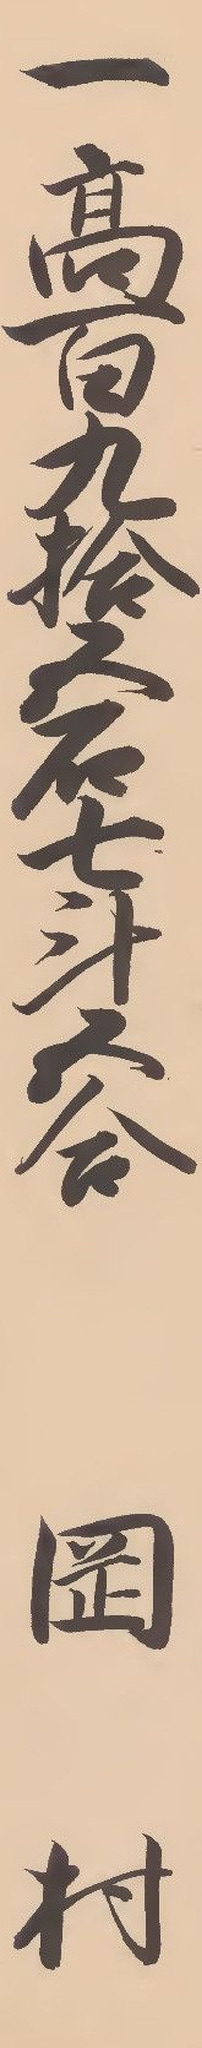一高百九拾五石七斗五合岡村

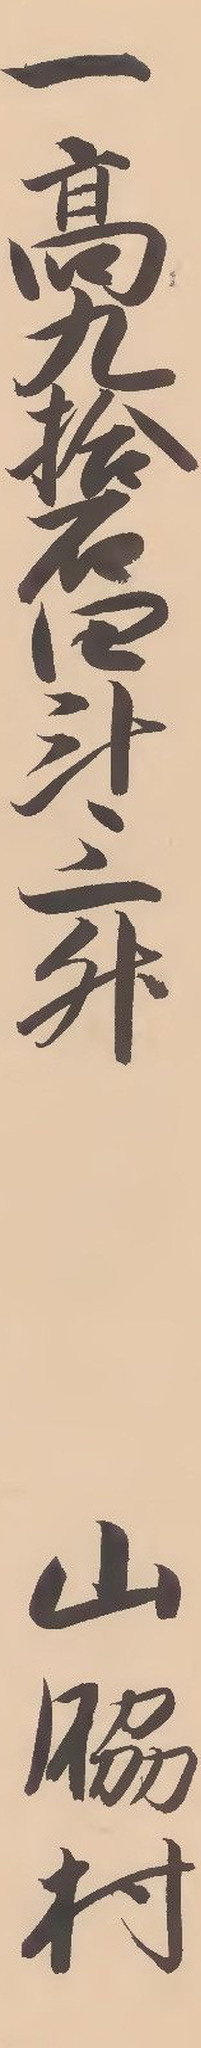一高九拾石四斗三升山脇村
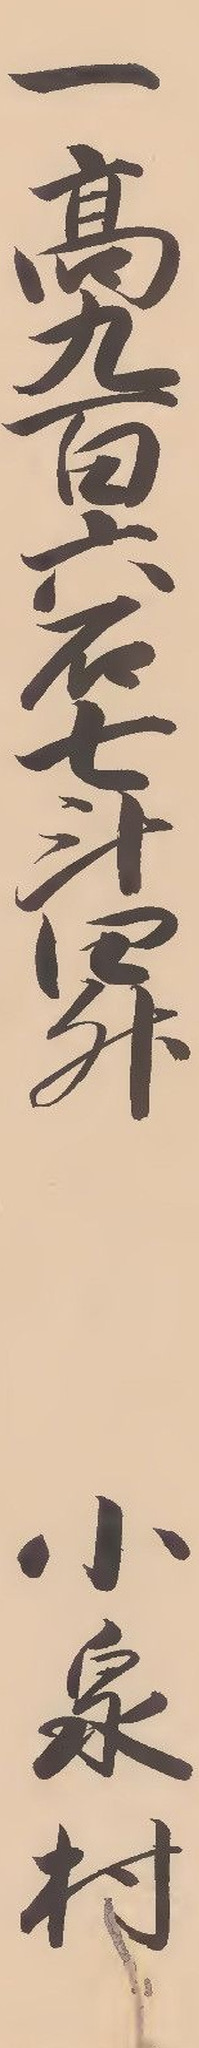一高九百六石七斗四升小泉村
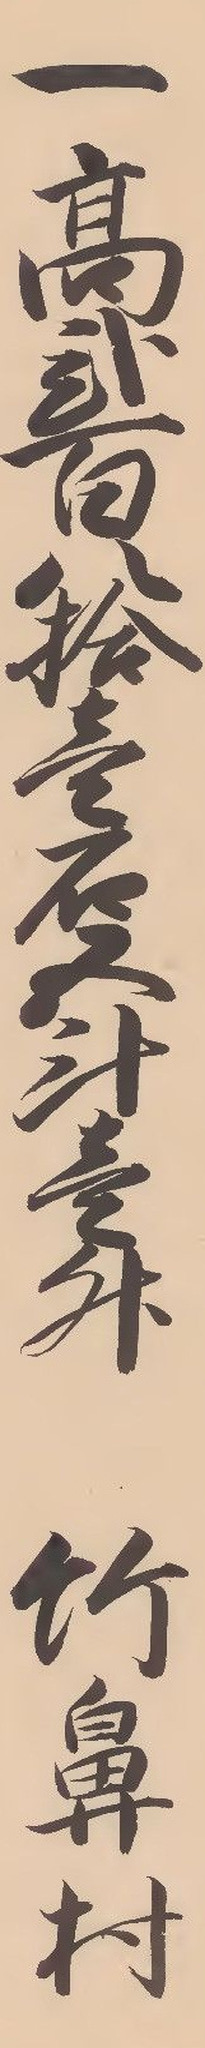一高弐百八拾壱石五斗壱升竹鼻村
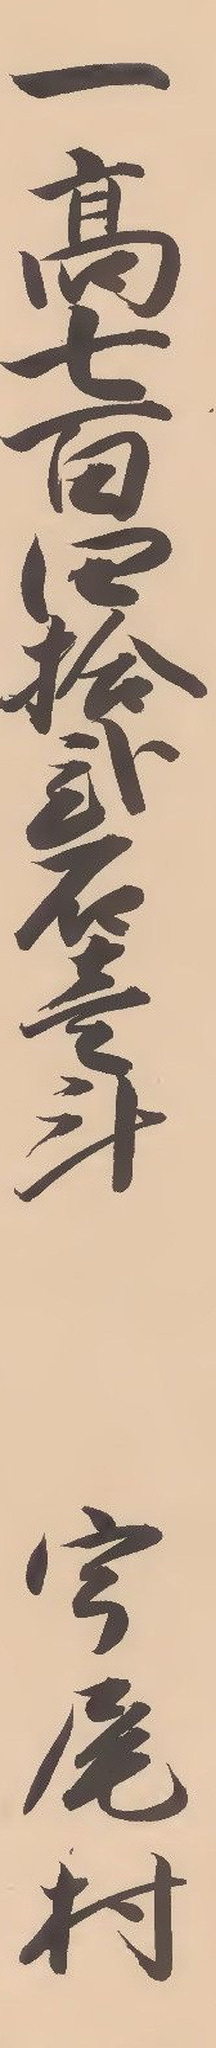一高七百四拾弐石壱斗宇尾村
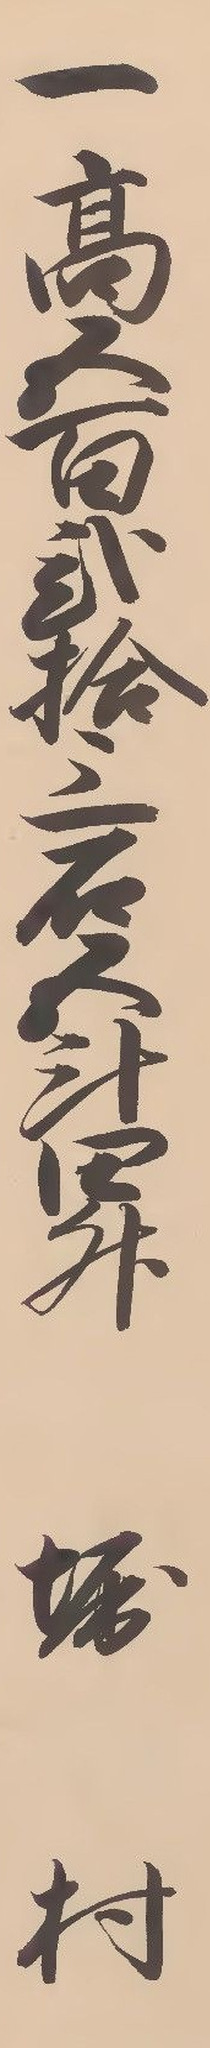一高五百弐拾三石五斗四升堀村
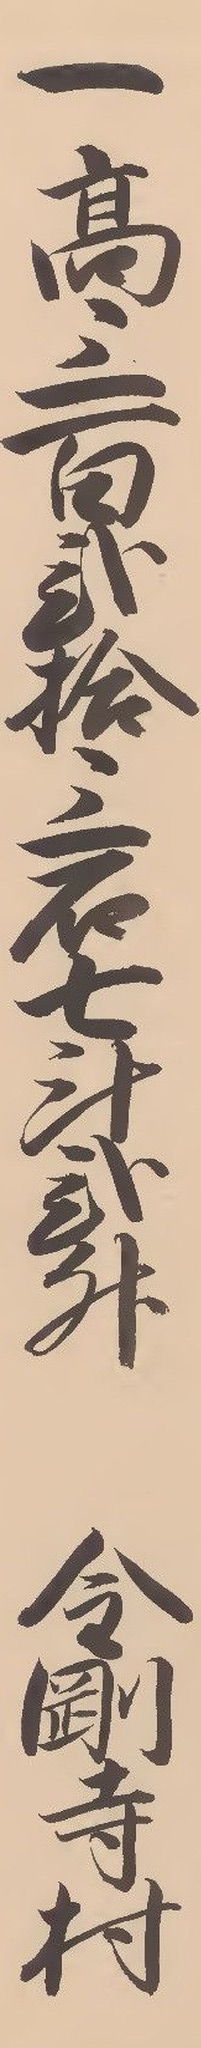一高三百弐拾三石七斗弐升金剛寺村
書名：近江国郷帳
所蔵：国立公文書館 National Archives of Japan
